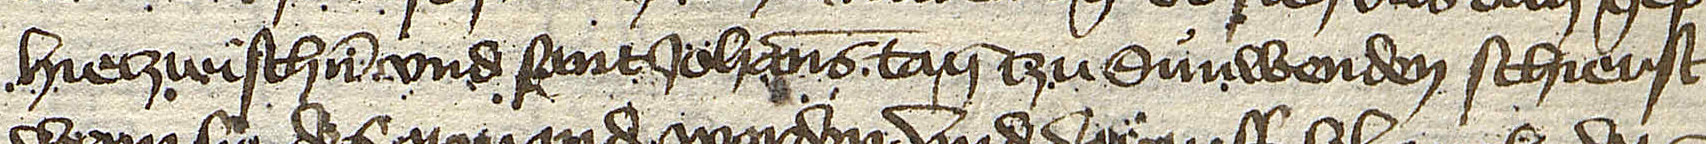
hiecʒwiſchn* vnd ſant Iohans*tag cʒu Sünwenden ſchierſt
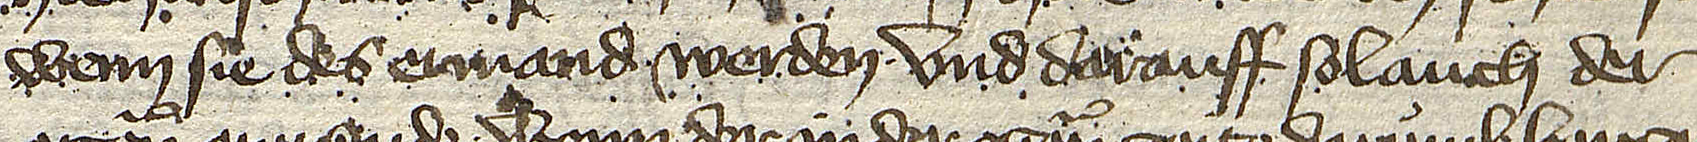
wenn ſie des ermand werden . vnd darauff ſol auch der
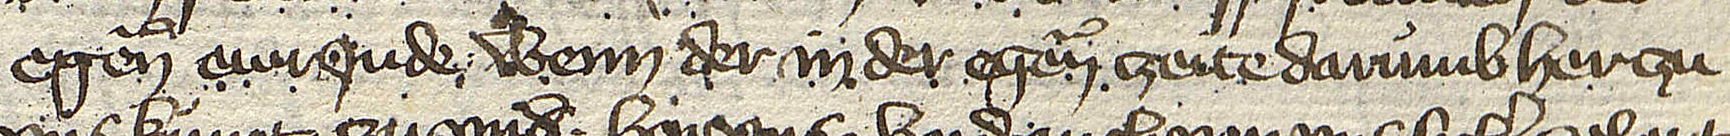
egen* ewr Iude wenn der in der egen* cʒeite darümb hercʒu
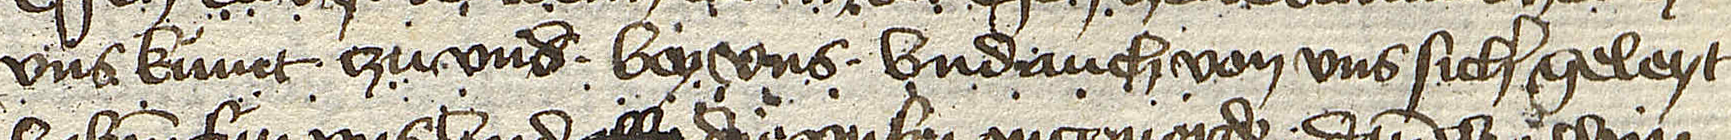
vns kümt cʒu vnd bey vns vnd auch von vns ſich* geleyt
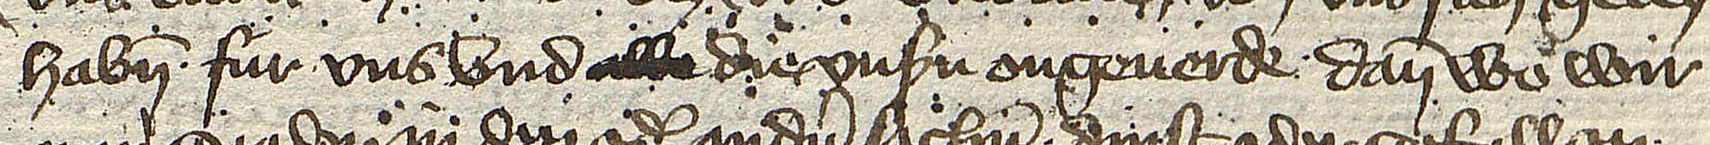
habn* für vns vnd alle die vnſ*n ongeuerde dan* wo wir
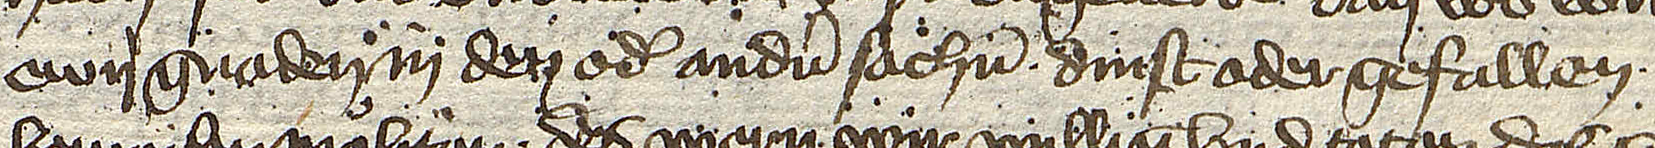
ewn* gnaden in den od* andn* ſachn* dinſt oder gefallen
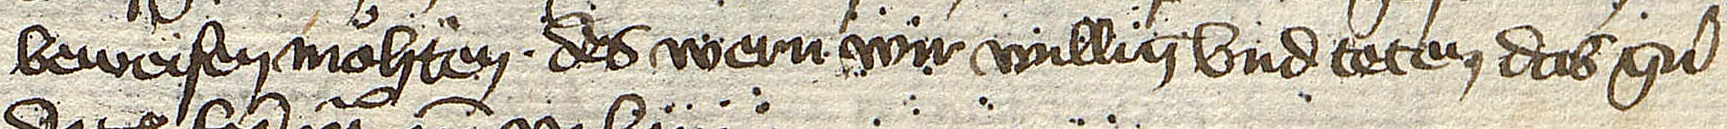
beweiſen möhten . des wern wir willig vnd teten das gn*
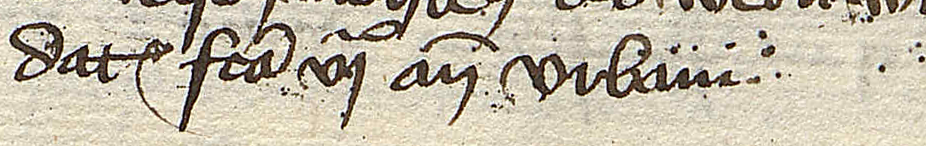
dat* fea* vi an* vrbani
